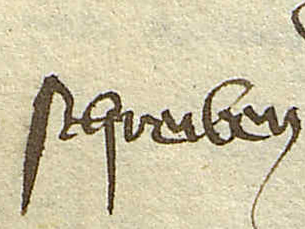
ſchreiben
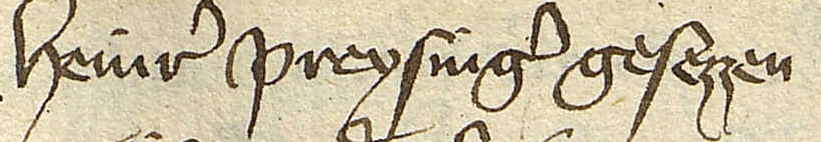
heinr* Preyſing* geſeʒʒen
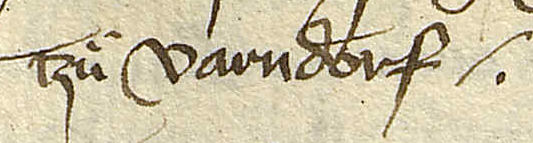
cʒü varndorf / .
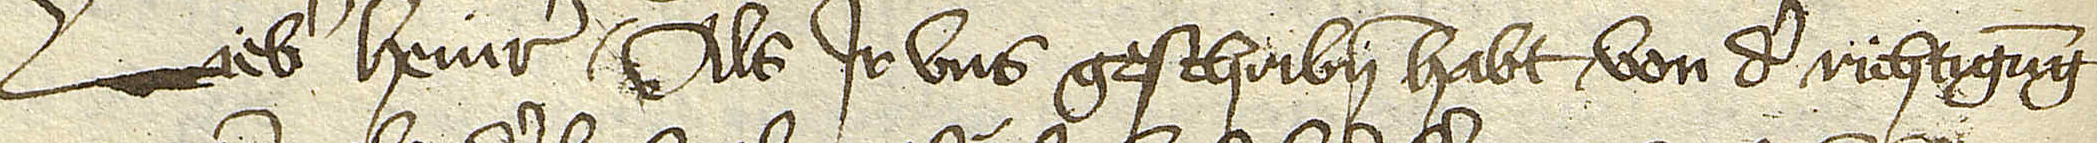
Lieb* heinr* / Als Ir vns geſchribn* habt / von d* richtigug*
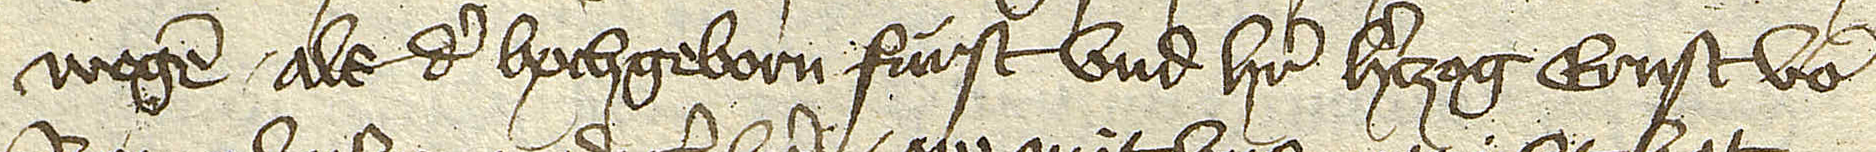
wege* / als d* hochgeborn fürſt vnd hr* h*cʒog Ernſt vo*
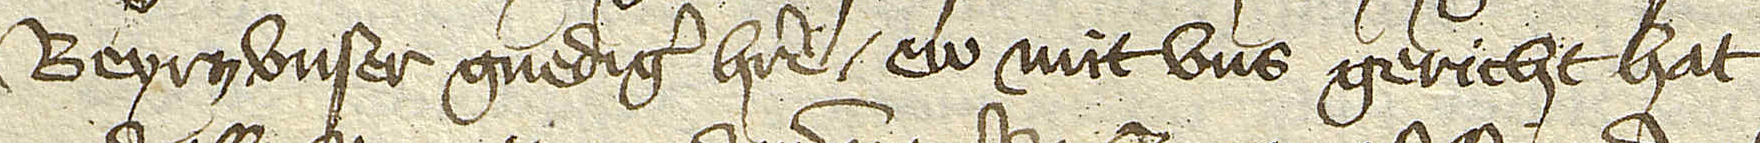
Beyrn vnſer gnedig* hr*e / ew mit vns gericht hat
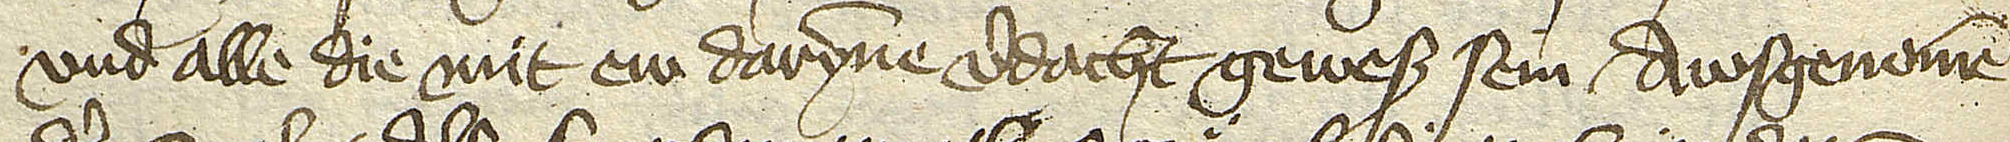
vnd alle die mit ew daryne* v*dacht geweſʒ ſein / Awſgenome*
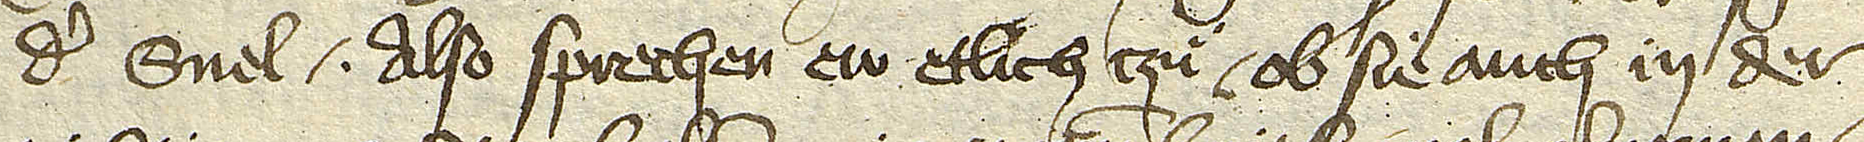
d* Snel / . Alſo ſprechen ew etlich cʒü / ob ſie auch in der
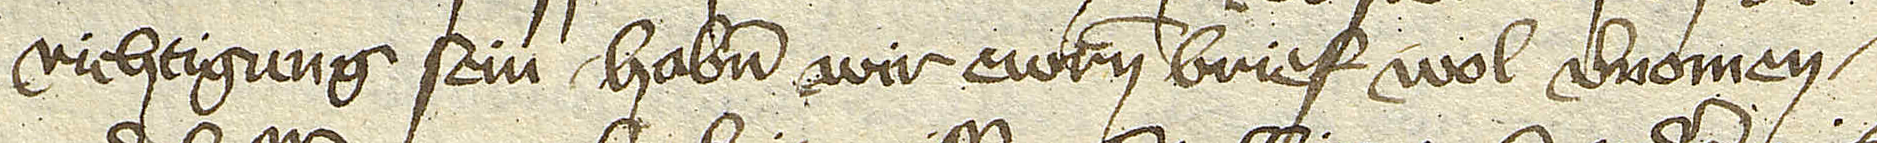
richtigung ſein / habn* wir ewrn* brief wol v*nomen /
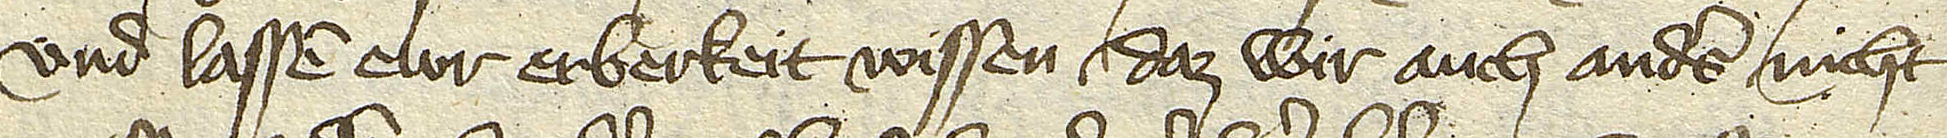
vnd laſſe* ewr erberkeit wiſſen / daʒ wir auch ands* nicht
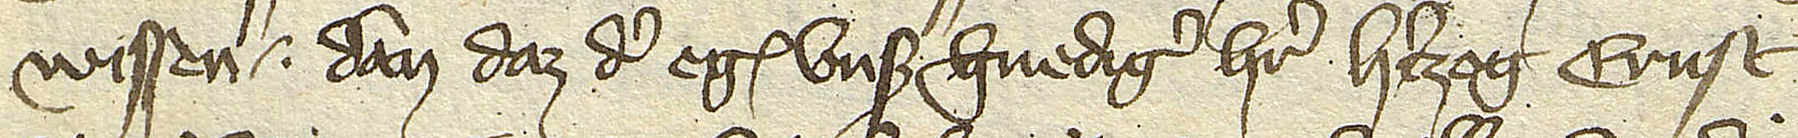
wiſſen / . dan* daʒ d* eg* vnſ* gnedig* hr* h*cʒog Ernſt
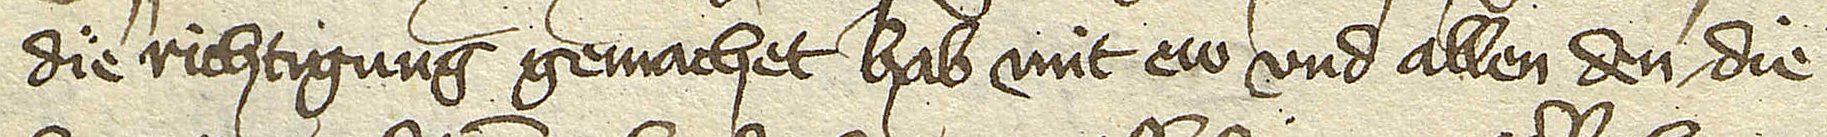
die richtigung gemachet hab mit ew vnd allen den / die
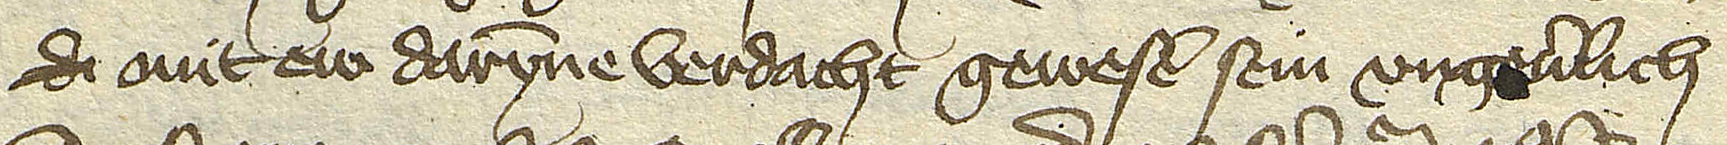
d mit ew daryne* verdacht geweſe* ſein vngeu*lich
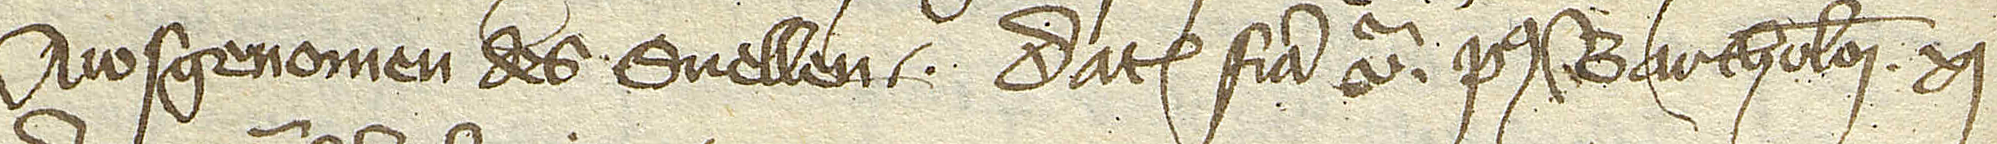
Awſgenomen des Snellen / . Dat* fia* v* p* Bartholoi* xi*
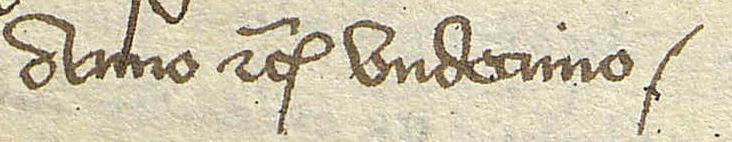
Anno ec* vndecimo /
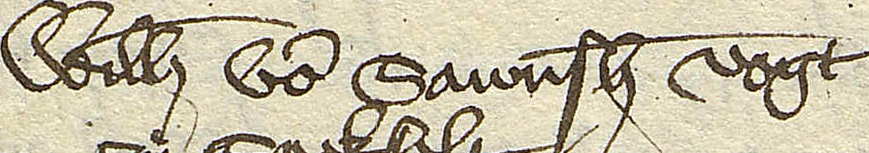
Wilh* vo* Sawnſh* vogt
